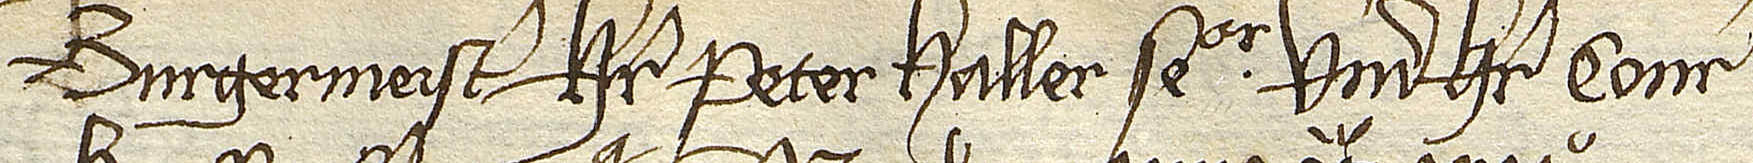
Burgermeiſt* H*r Peter Haller ſe* . Vnd H*r Conr*
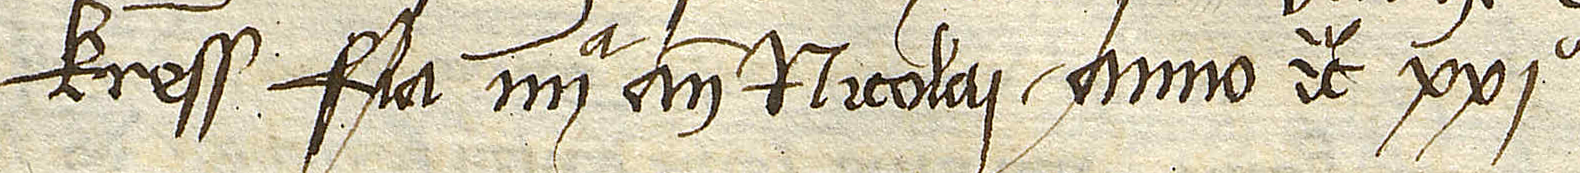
Kreſſ fia* iiii* an* Nicolai / anno ec* xxi*
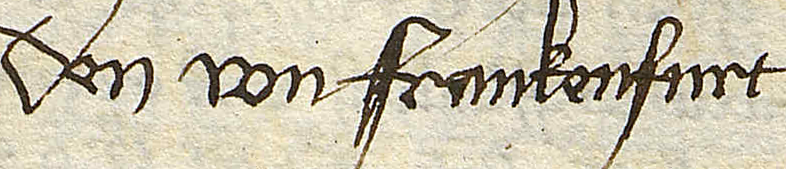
Den von Frankenfurt
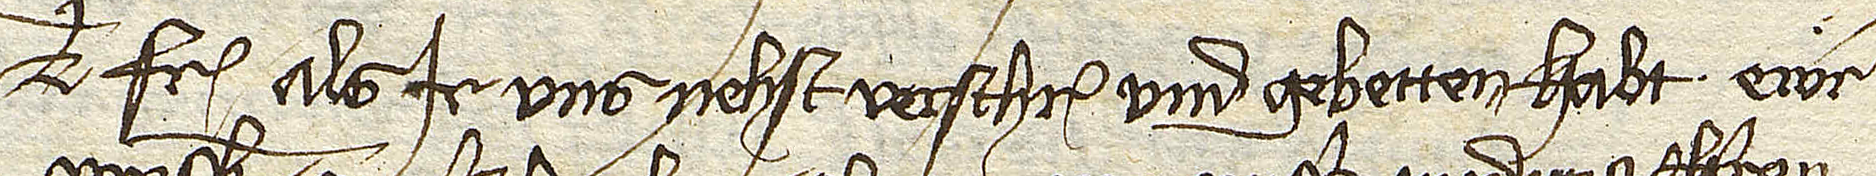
L* fr* als Ir vns nehſt verſchr* vnd gebetten habt . ew*r
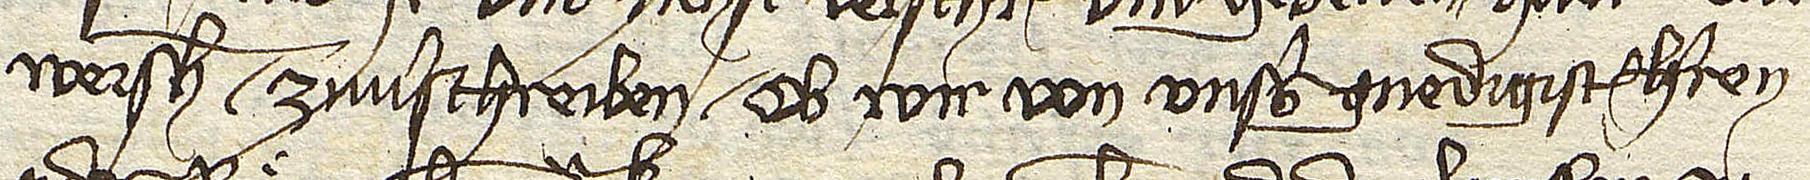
weiſh* / ʒuu*ſchreiben / Ob wir von vnſ*s gnedigiſt* h*ren
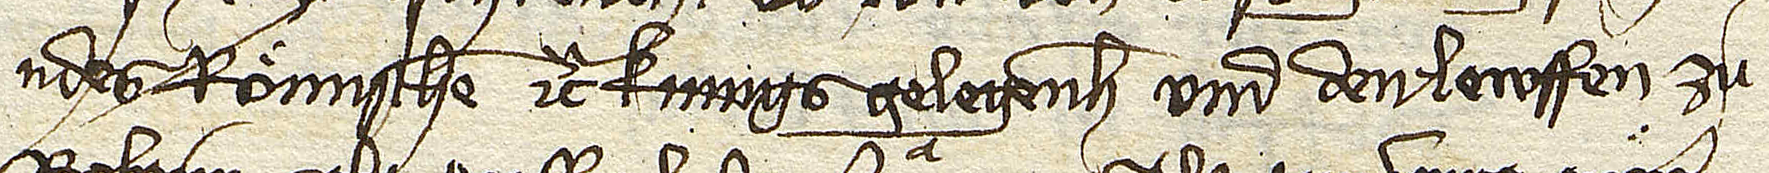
~ des Römiſche* ec* kunigs gelegenh* vnd den lewffen ʒu
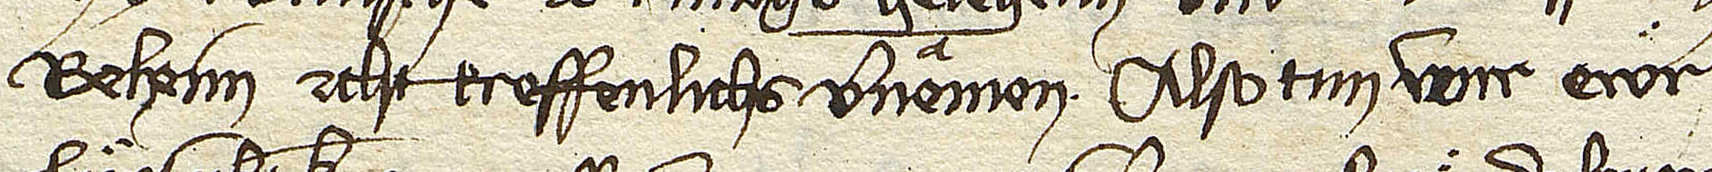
Beheim icht treffenlichs v*nëmen . Alſo tun wir ew*r
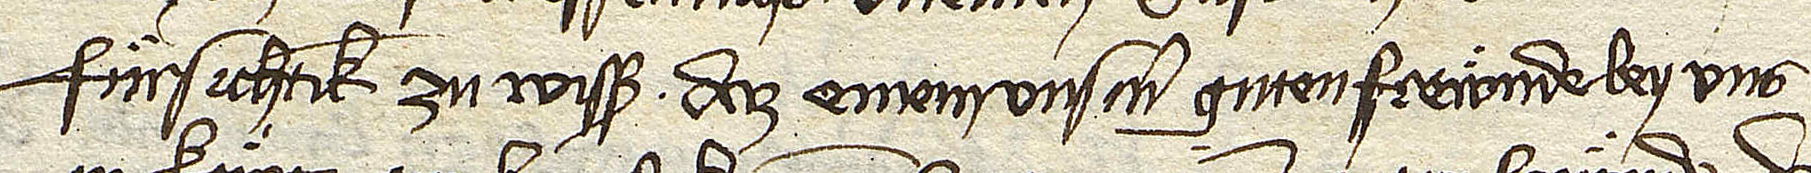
fürſichtik* ʒu wiſſ* . daʒ einem vnſ*n guten frewnde bey vns
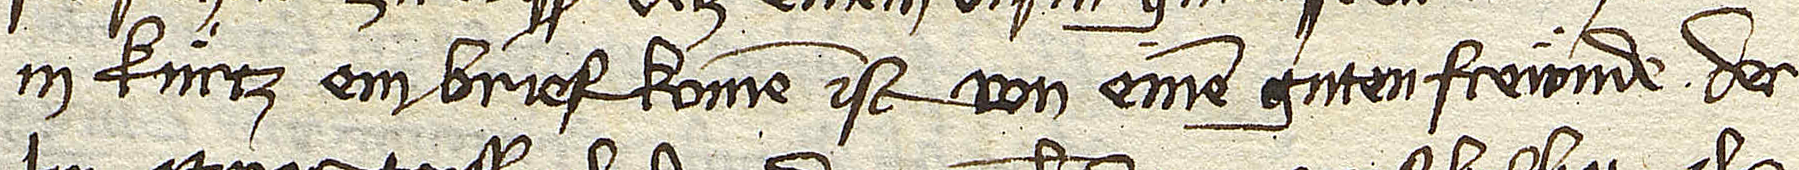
in kürcʒ ein brief kome* iſt von eine* guten frewnde . der
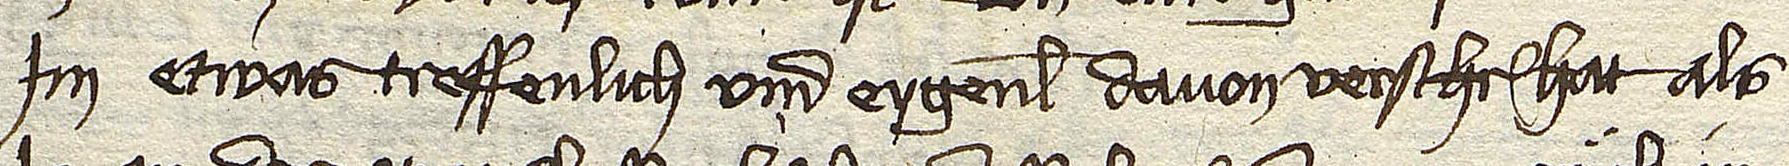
Im etwas treffenlich vnd eygenl* dauon verſchr* hat als
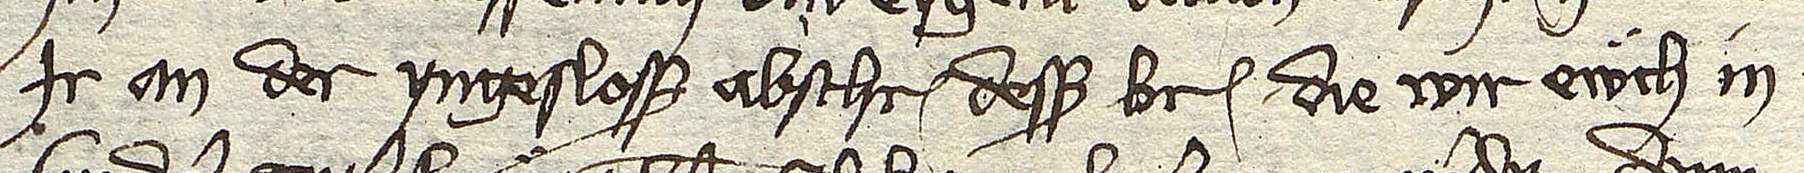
Ir an der yngeſloſſ* abſchr* deſſ* br* / die wir ewch in
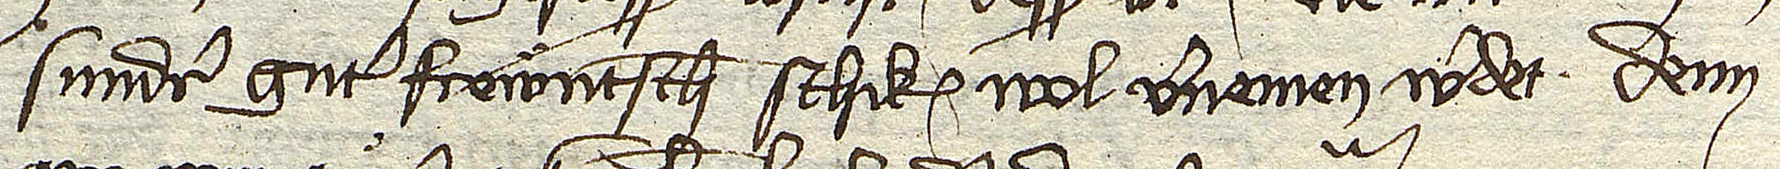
ſundr* gut* frewntſch* ſchik* wol v*nemen w*det . Denn
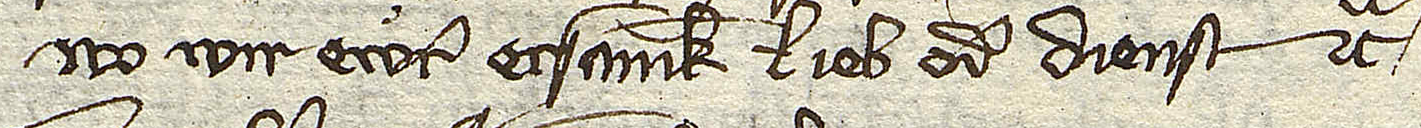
wo wir ew*r erſamk* lieb od* dienſt ec*
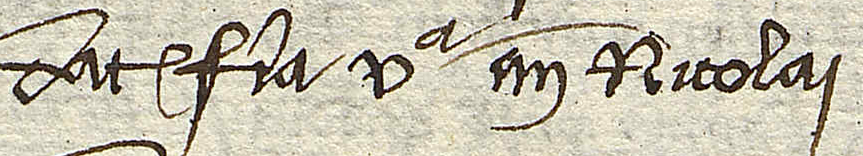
Dat* fia* v* an* Nicolai
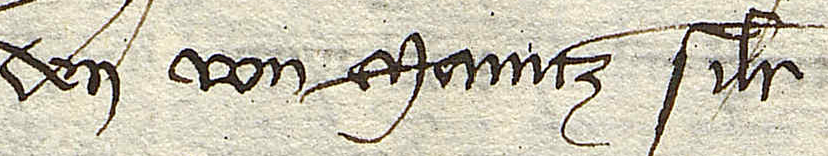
Den von Maincʒ ſilr*
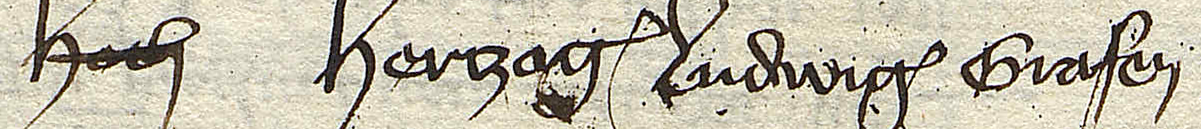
Hoch Hercʒog* ludwig* Grafen
